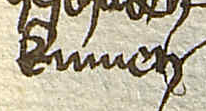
kumen
